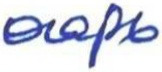огарь
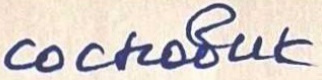сосновик
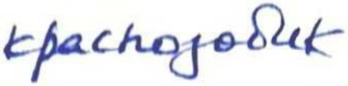краснозобик
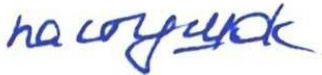пастушок
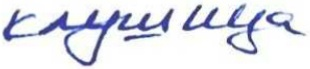клушица
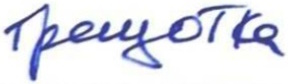трещотка
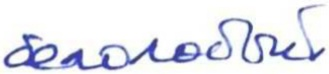белолобый
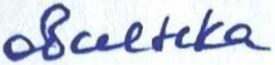овсянка
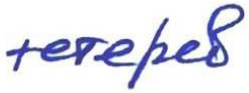тетерев
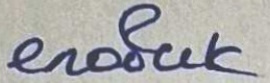еловик
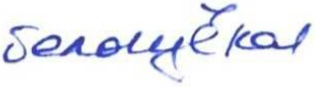белощёкая
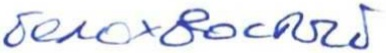белохвостый
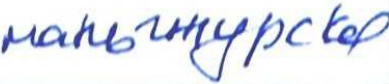маньчжурскя
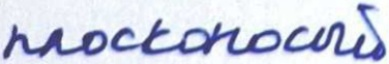плосконосый
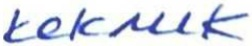кеклик
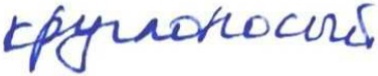круглоносый
